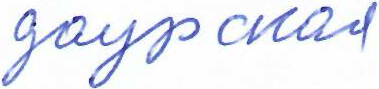даурская
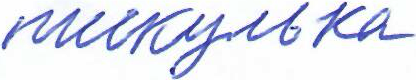пискулька
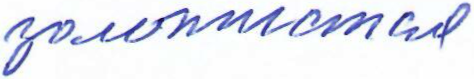золотистая
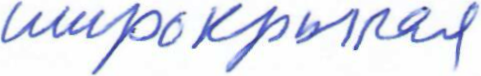широкрылая
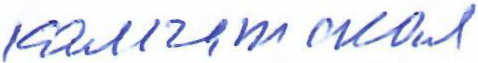камчатская
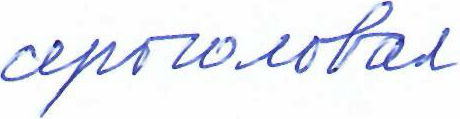сероголовая
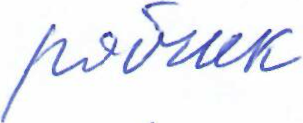рябчик
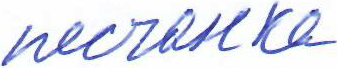песчанка
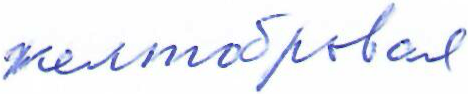желтобровая
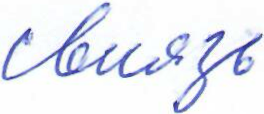свиязь
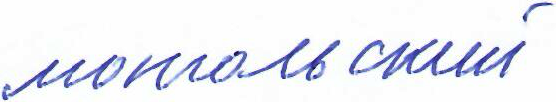монгольский
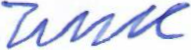чиж
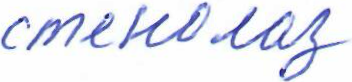стенолаз
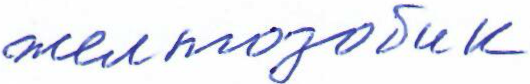желтозобик
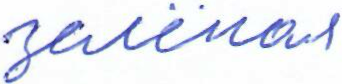зелёная
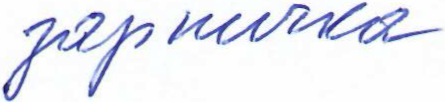зарничка
